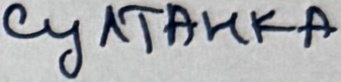султанка
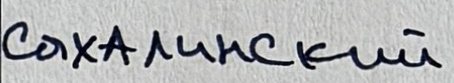сахалинский
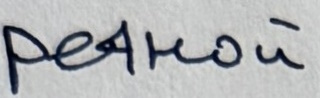речной
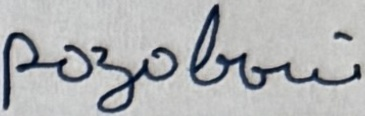розовый
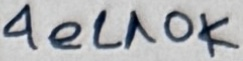чеглок
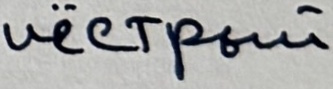пёстрый
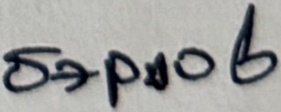бэрдов
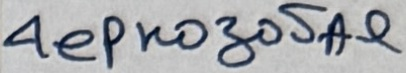чернозобая
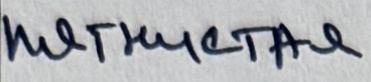пятнистая
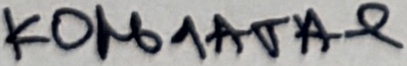кольчатая
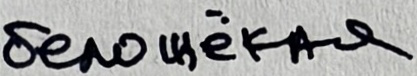белощёкая
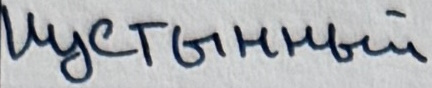пустынный
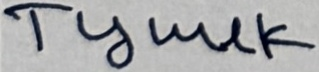тупик
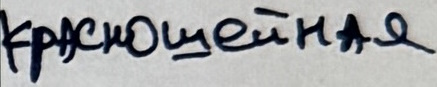красношейная
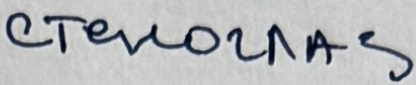стеноглаз
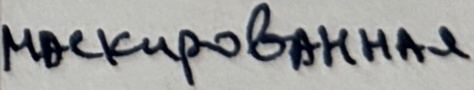маскированная
